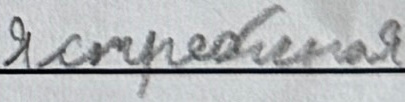ястребиная
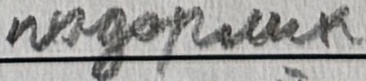подорлик
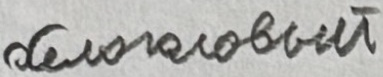белоголовый
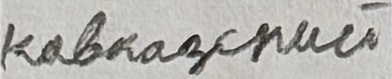кавказспий
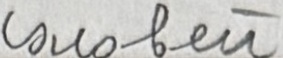соловей
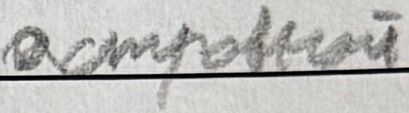островной
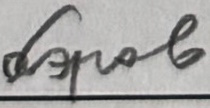бэров
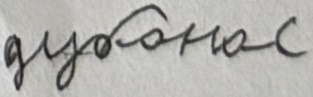дубонос
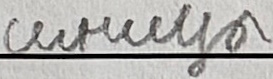синица
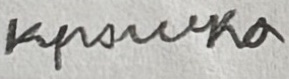крошка
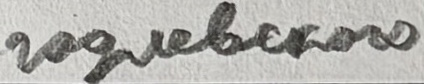годлевского
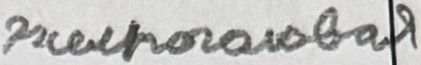желпоголовая
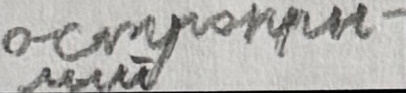острокры-лый
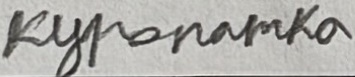куропатка
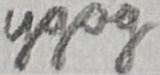удод
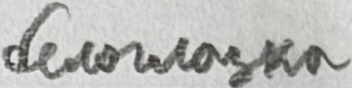белоглазка
